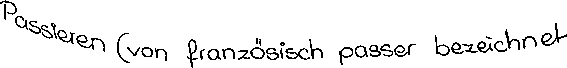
Passieren (von französisch passer bezeichnet
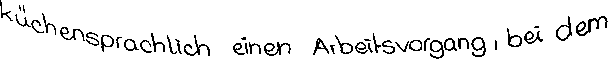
küchensprachlich einen Arbeitsvorgang, bei dem
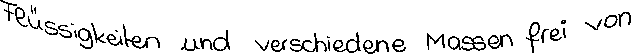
Flüssigkeiten und verschiedene Massen frei von
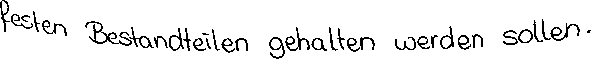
festen Bestandteilen gehalten werden sollen.
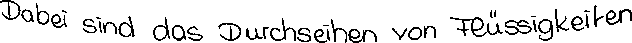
Dabei sind das Durchseihen von Flüssigkeiten
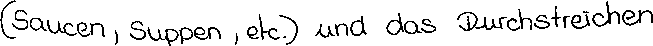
(Saucen, Suppen etc.) und das Durchstreichen
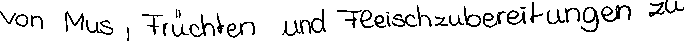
von Mus, Früchten und Fleischzubereitungen zu
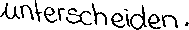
unterscheiden.
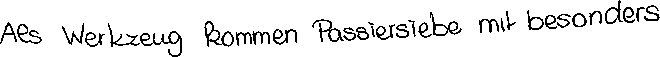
Als Werkzeug kommen Passiersiebe mit besonders
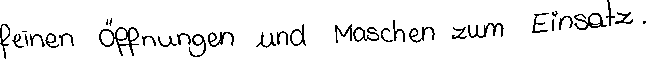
feinen Öffnungen und Maschen zum Einsatz.
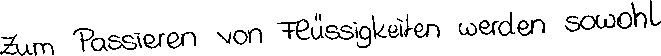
Zum Passieren von Flüssigkeiten werden sowohl
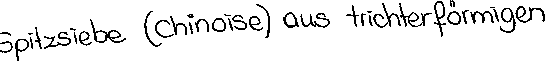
Spitzsiebe (Chinoise) aus trichterförmigen
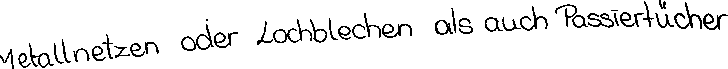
Metallnetzen oder Lochblechen als auch Passiertücher
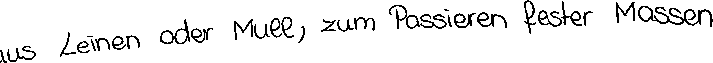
aus Leinen oder Mull, zum Passieren fester Massen
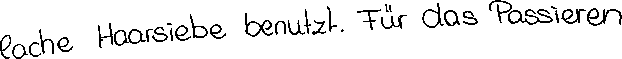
flache Haarsiebe benutzt. Für das Passieren
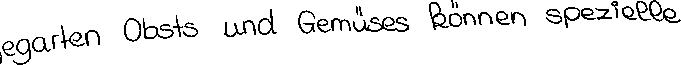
egarten Obsts und Gemüses können spezielle
